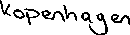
Kopenhagen
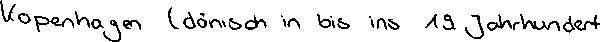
Kopenhagen (dänisch in bis ins 19. Jahrhundert
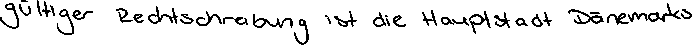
gültiger Rechtschreibung ist die Hauptstadt Dänemarks
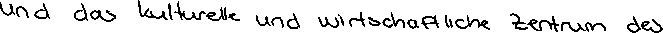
und das kulturelle und wirtschaftliche Zentrum des
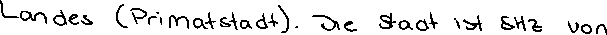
Landes (Primatstadt). Die Stadt ist Sitz von
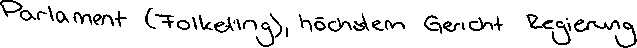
Parlament (Folketing), höchstem Gericht Regierung
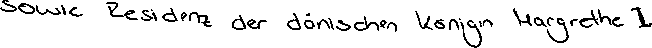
sowie Residenz der dänischen Königin Margrethe I
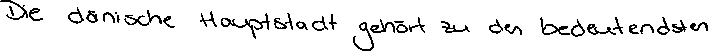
Die dänische Hauptstadt gehört zu den bedeutendsten
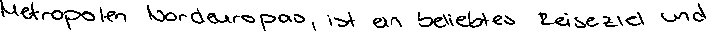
Metropolen Nordeuropas, ist ein beliebtes Reiseziel und
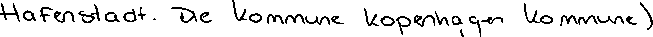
Hafenstadt. Die Kommune Kopenhagen Kommune)
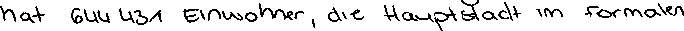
hat 644.431 Einwohner, die Hauptstadt im formalen
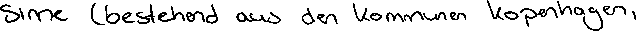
Sinne (bestehend aus den Kommunen Kopenhagen,
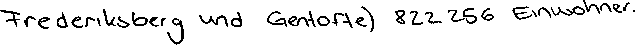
Frederiksberg und Gentofte) 822.256 Einwohner.
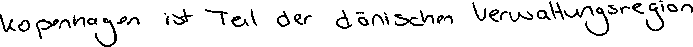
Kopenhagen ist Teil der dänischen Verwaltungsregion
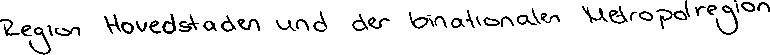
Region Hovedstaden und der binationalen Metropolregion
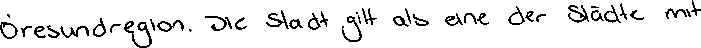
Öresundregion. Die Stadt gilt als eine der Städte mit
